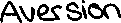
Aversion
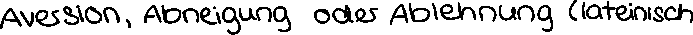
Aversion, Abneigung oder Ablehnung (lateinisch
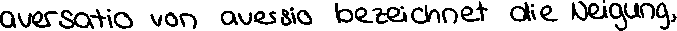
aversatio von aversio bezeichnet die Neigung,
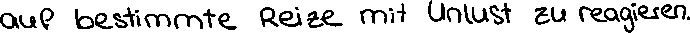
auf bestimmte Reize mit Unlust zu reagieren.
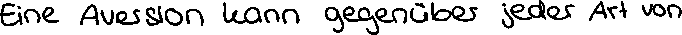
Eine Aversion kann gegenüber jeder Art von
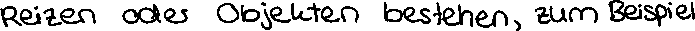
Reizen oder Objekten bestehen, zum Beispiel
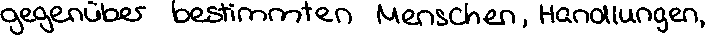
gegenüber bestimmten Menschen, Handlungen,
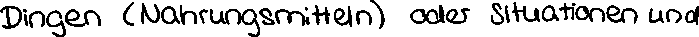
Dingen (Nahrungsmitteln) oder Situationen und
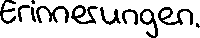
Erinnerungen.
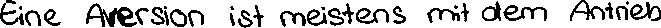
Eine Aversion ist meistens mit dem Antrieb
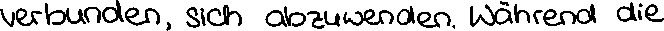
verbunden, sich abzuwenden. Während die
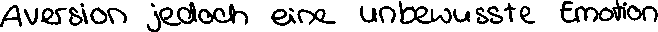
Aversion jedoch eine unbewusste Emotion
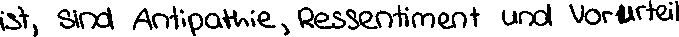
ist, sind Antipathie, Ressentiment und Vorurteil
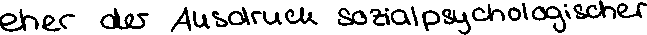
eher der Ausdruck sozialpsychologischer
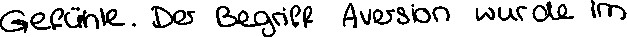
Gefühle. Der Begriff Aversion wurde im
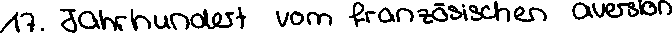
17. Jahrhundert vom französischen aversion
